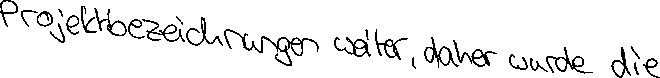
Projektbezeichnungen weiter, daher wurde die
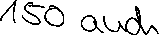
150 auch
